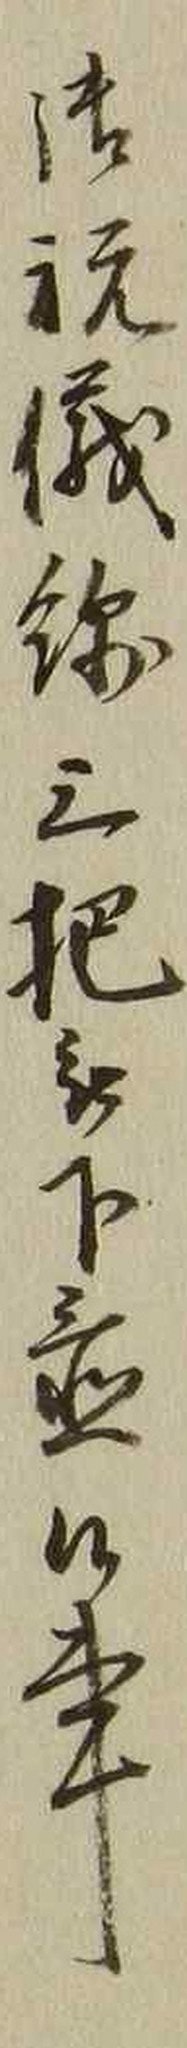御祝儀綿三把被下置候事
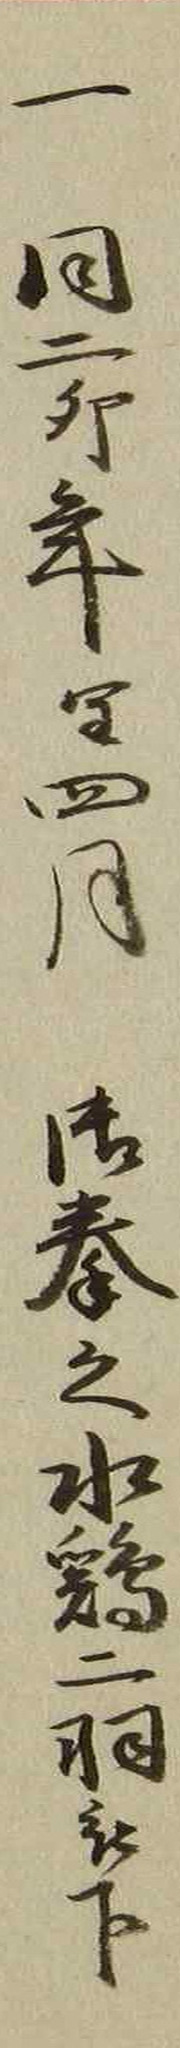一同二卯年閏四月御拳之水鶏二羽被下
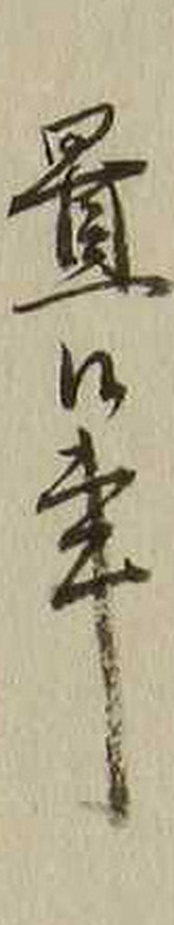置候事
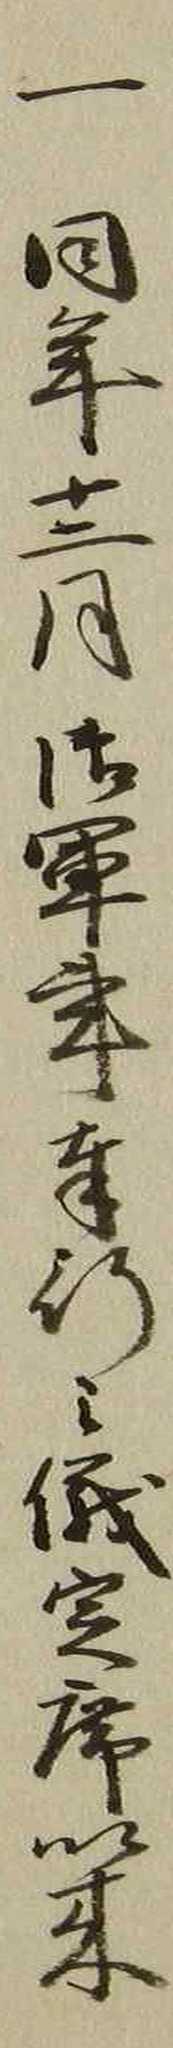一同年十二月御軍事奉行之儀定席以来
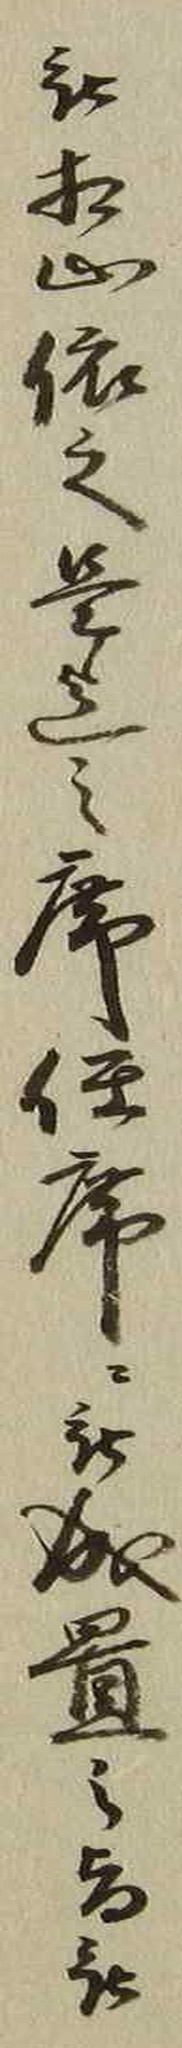被相止依之是迄之席任席に被成置之旨被
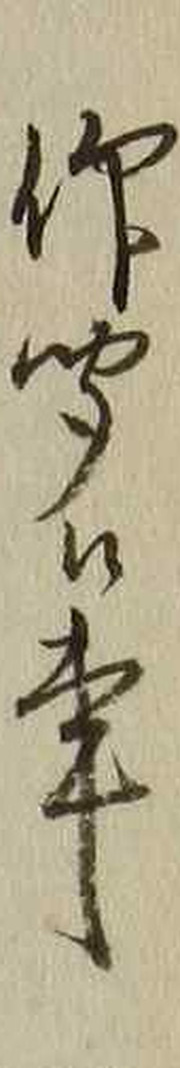仰聞候事
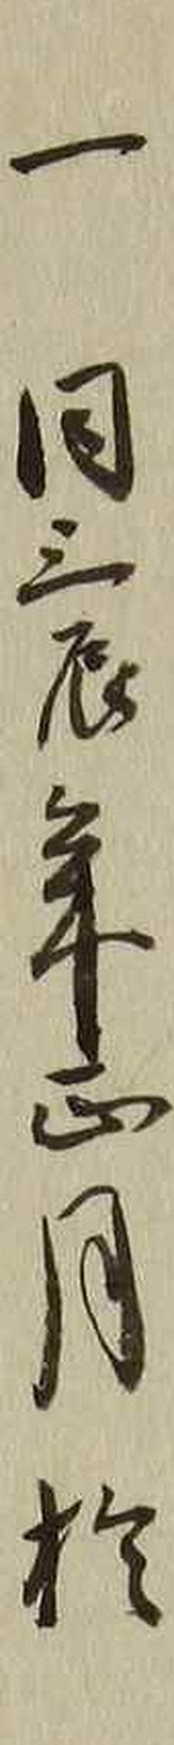一同三辰年正月於
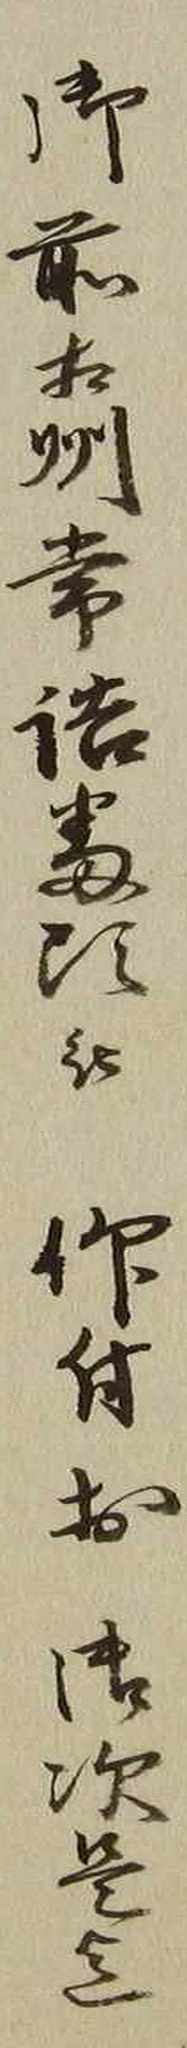御前相州常詰番頭被仰付於御次是迄
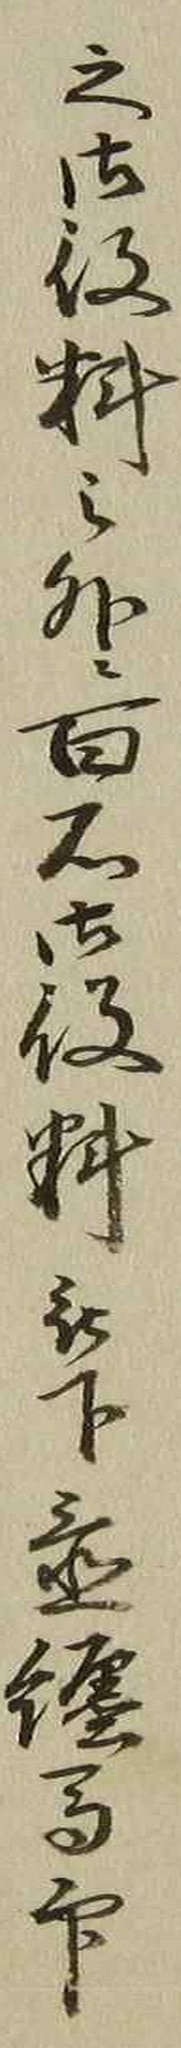之御役料之外百石御役料被下置纏馬印
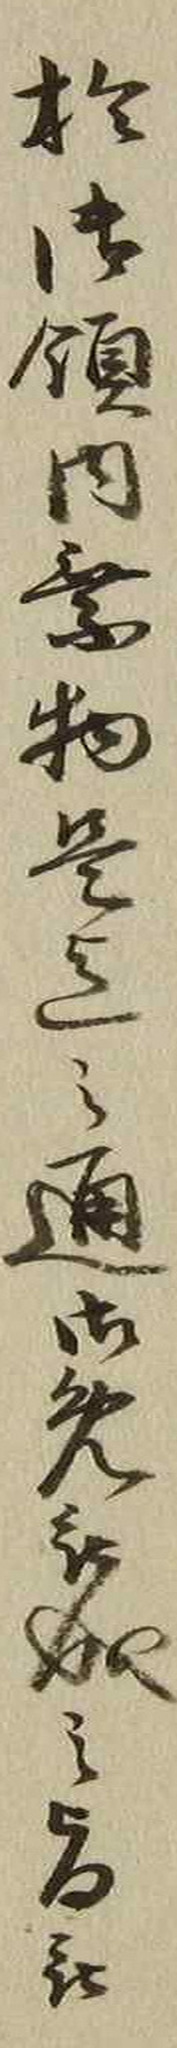於御領内乗物是迄之通御免被成之旨被
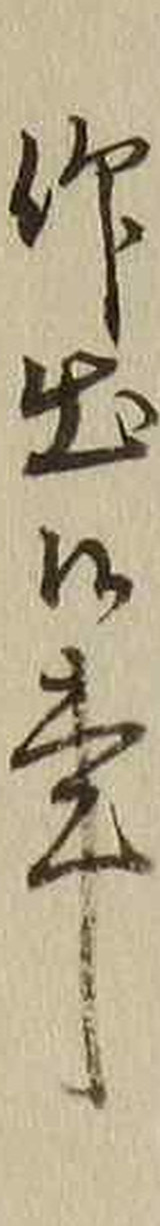仰出候事
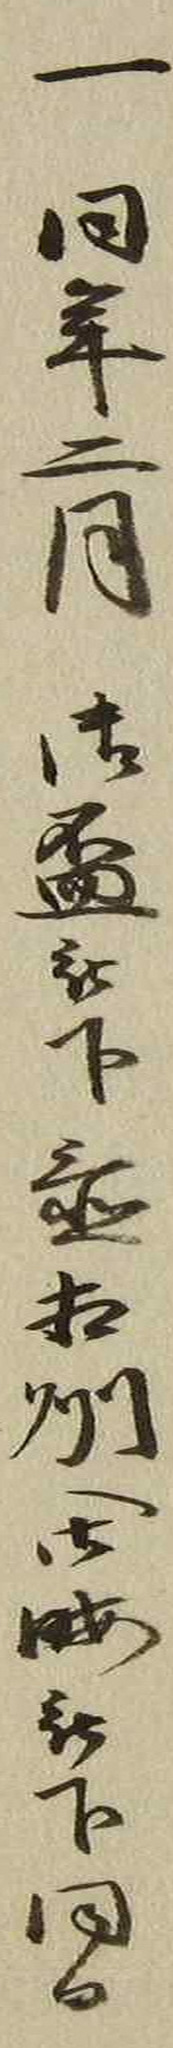一同年二月御杯被下置相州へ御暇被下同日
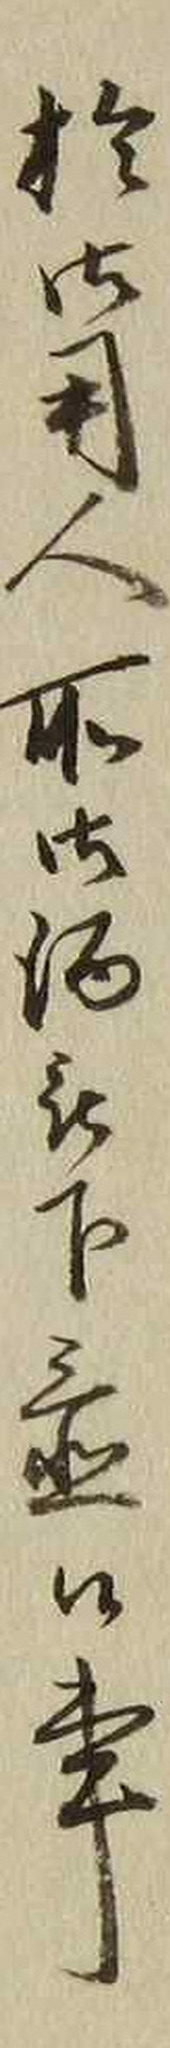於御用人所御酒被下置候事
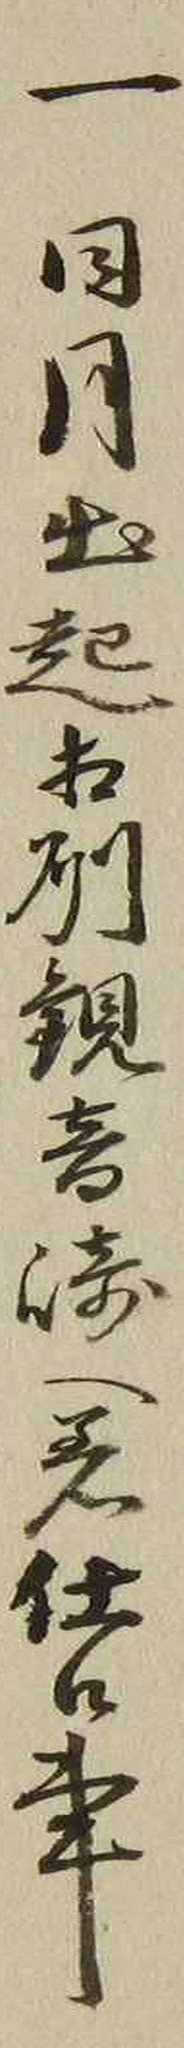一同月出起相州観音崎へ着仕候事
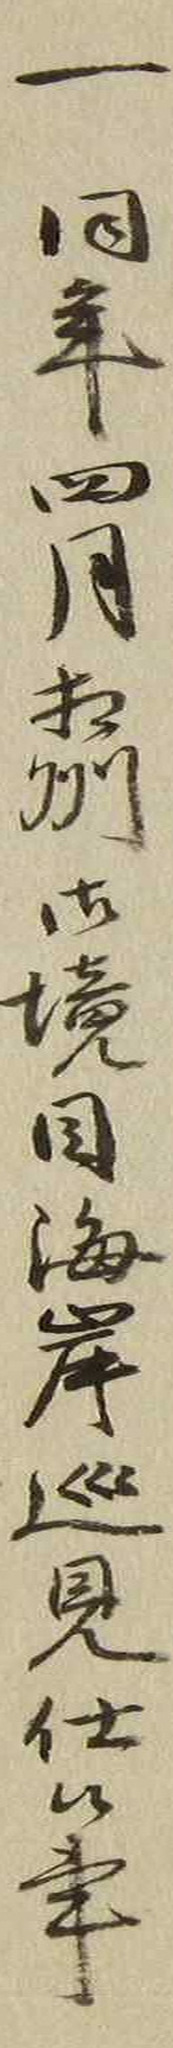一同年四月相州御境目海岸巡見仕候事
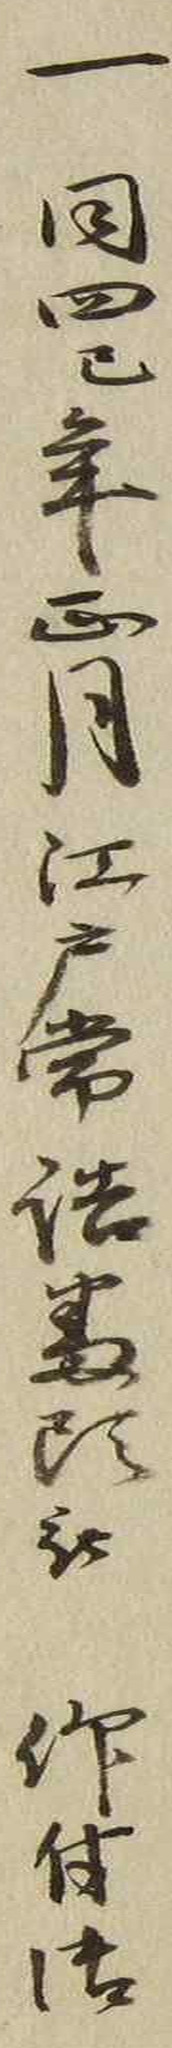一同四巳年正月江戸常詰番頭被仰付御
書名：諸士系譜　巻之133　た之部9
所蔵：会津若松市立会津図書館
